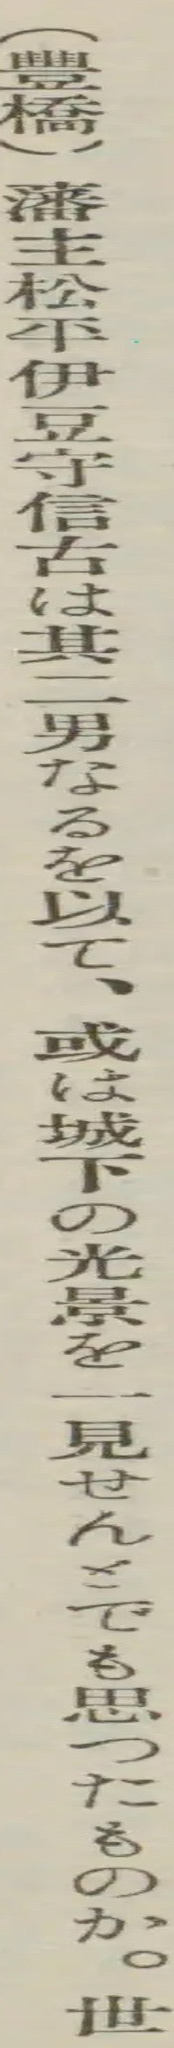(豊橋)藩主松平伊豆守信古は其二男なるを以て、或は城下の光景を一見せんとでも思つたものか。世
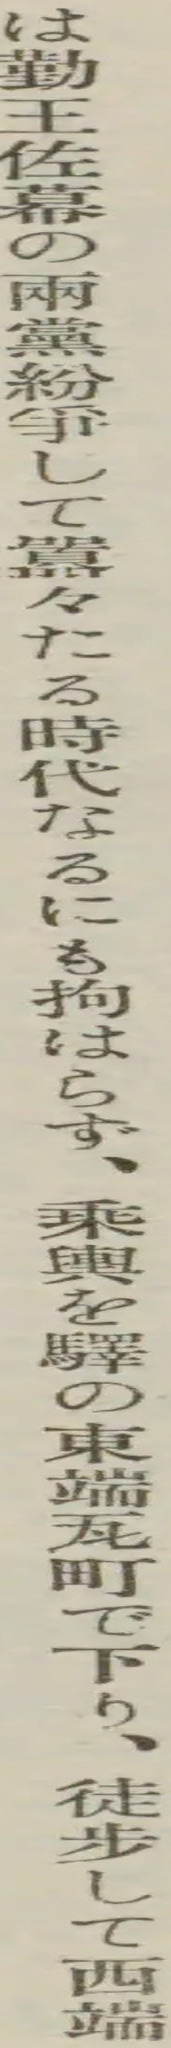は勤王佐幕の両党紛争して囂々たる時代なるにも拘はらず、乗輿を駅の東端瓦町で下り、徒歩して西端
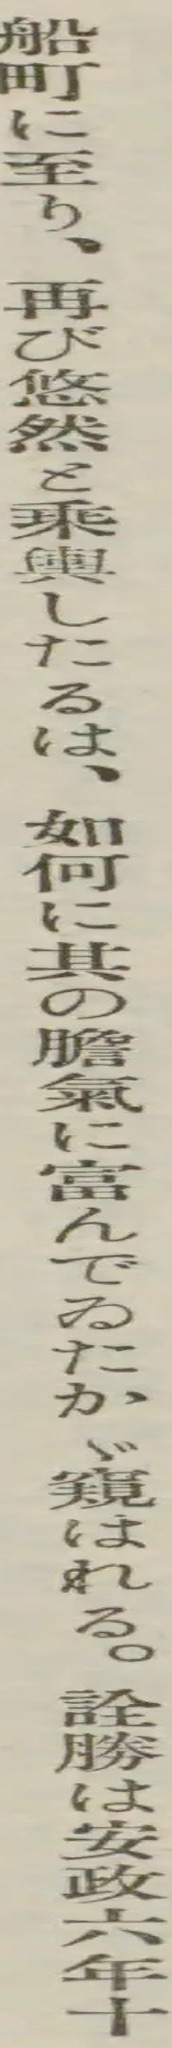船町に至り、再び悠然と乗輿したるは、如何に其の胆気に富んでゐたかゞ窺はれる。詮勝は安政六年十
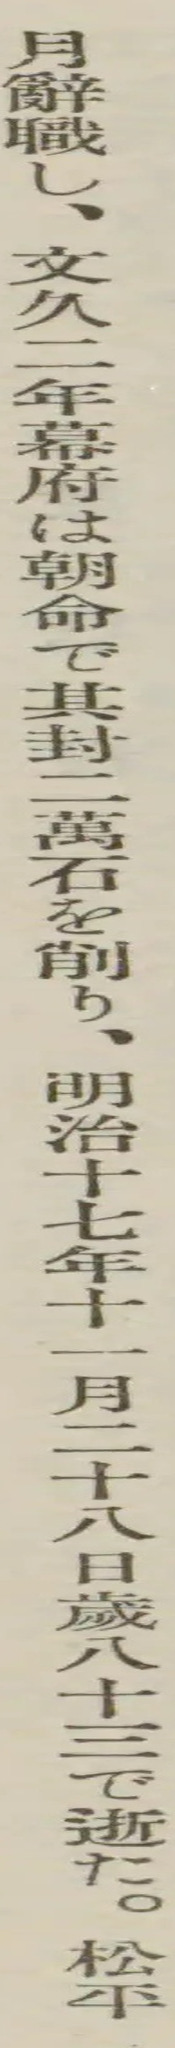月辞職し、文久二年幕府は朝命で其封二万石を削り、明治十七年十一月二十八日歳八十三で逝た。松平
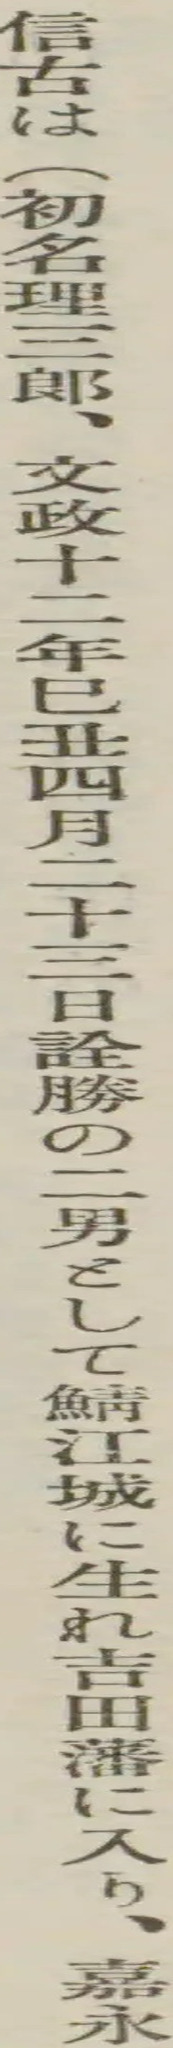信古は(初名理三郎、文政十二年己丑四月廿三日詮勝の二男として鯖江城に生れ吉田藩に入り、嘉永
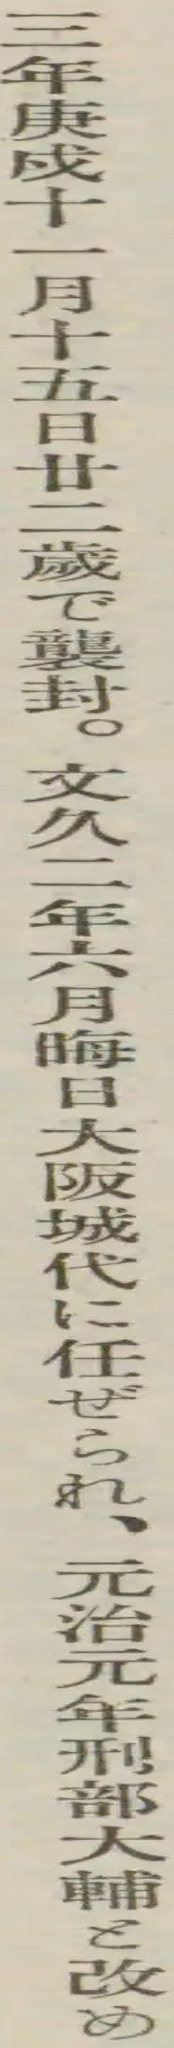三年庚戌十一月十五日廿二歳で襲封。文久二年六月晦日大坂城代に任ぜられ、元治元年刑部大輔と改め
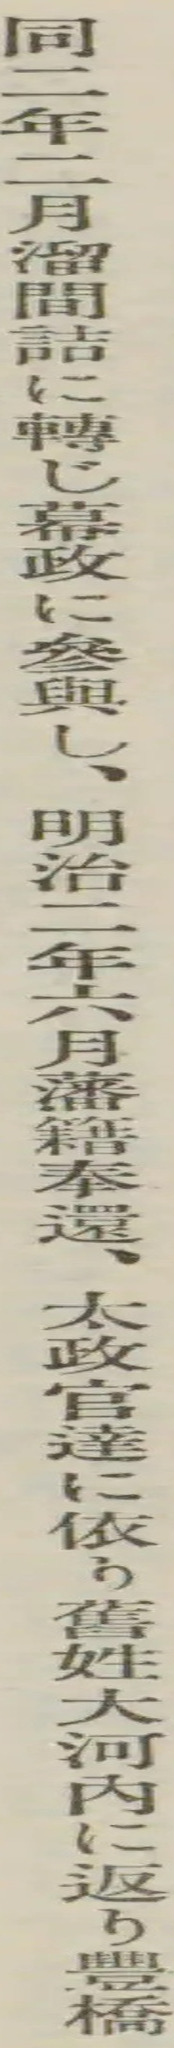同二年二月溜間詰に転じ幕政に参与し、明治二年六月版籍奉還、太政官達に依り旧姓大河内に返り豊橋
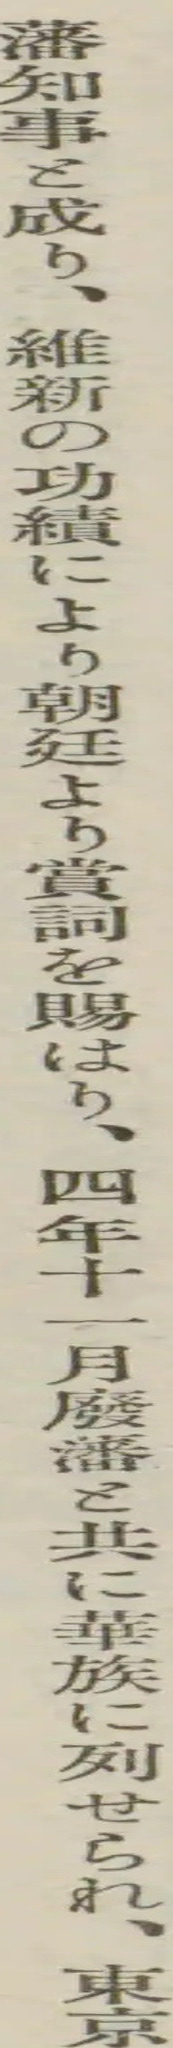潘知事と成り、維新の功績により朝廷より賞詞を賜はり、四年十一月廃藩と共に華族に列せられ、東京
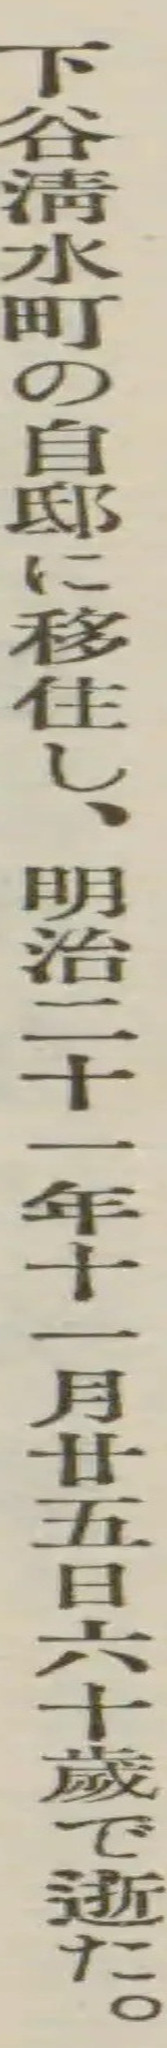下谷清水町の自邸に移住し、明治二十一年十一月廿五日六十歳で逝た。

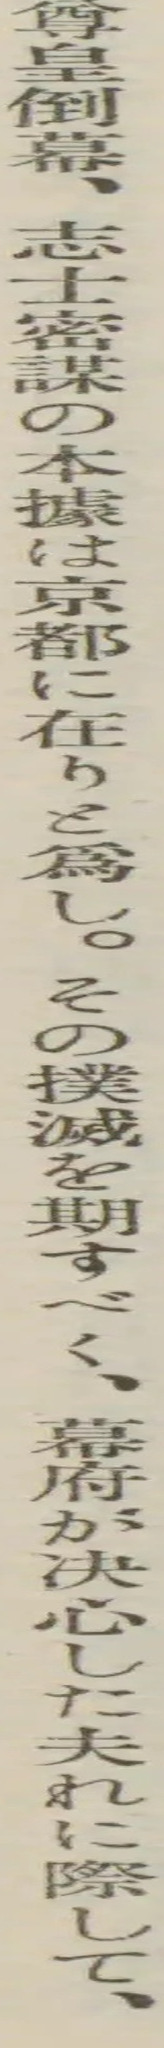尊王倒幕、志士密謀の本拠は京都に在りと為し。その撲滅を期すべく、幕府が決心した夫れに際して、
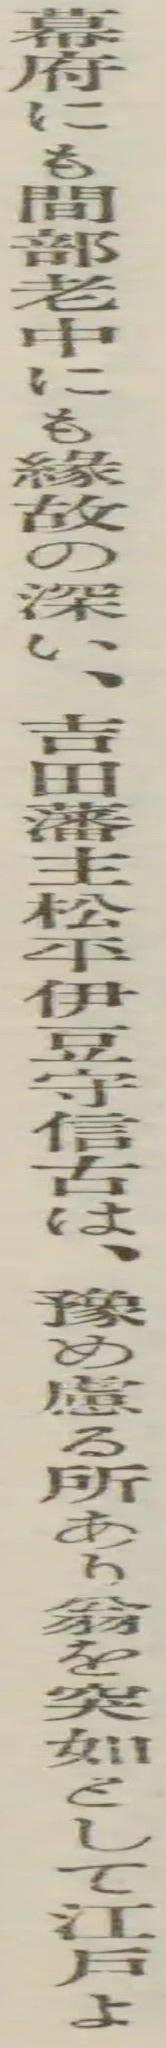幕府にも間部老中にも縁故の深い、吉田藩主松平伊豆守信古は、豫め慮る所あり翁を突如として江戸よ
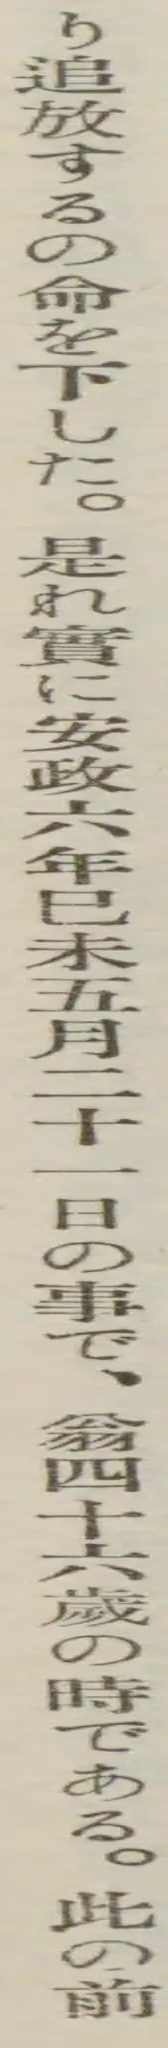り追放するの命を下した。是れ実に安政六年己未五月二十一日の事で翁四十六歳の時である。此の前
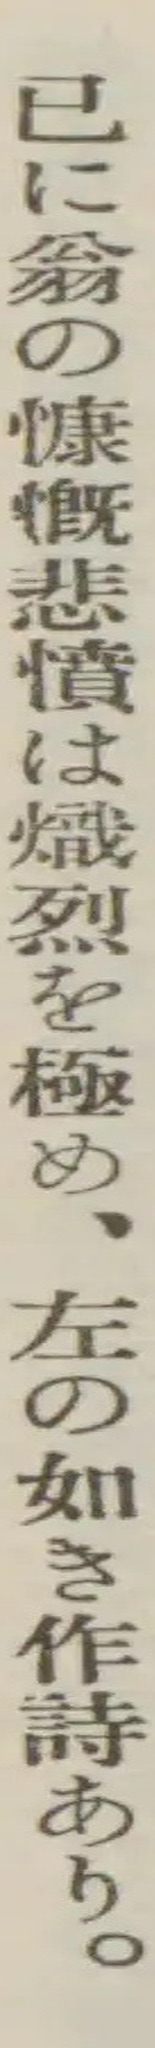已に翁の慷慨悲憤は熾烈を極め、左の如き作詩あり。
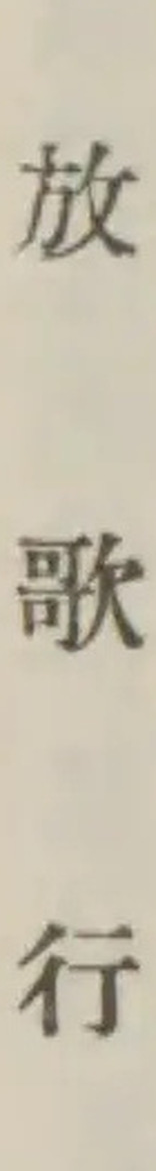放歌行
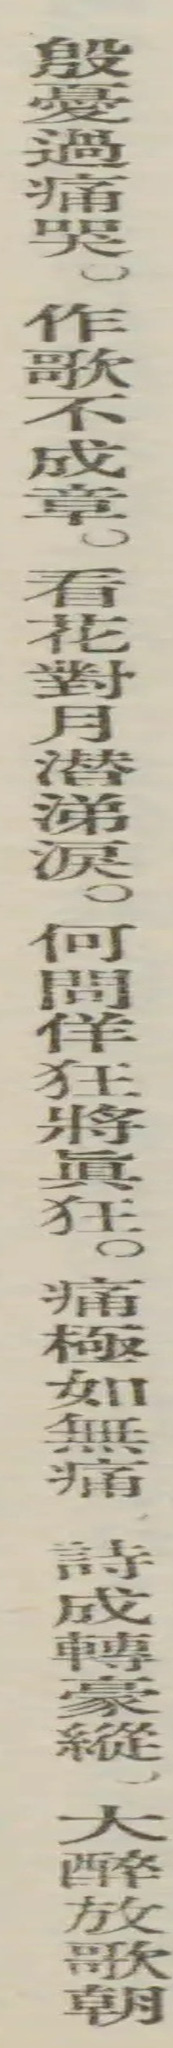殷憂過痛哭。作歌不成章。看花對月潜涕涙。何問佯狂將真狂。痛極如無痛。詩成轉豪縦。大酔放歌朝
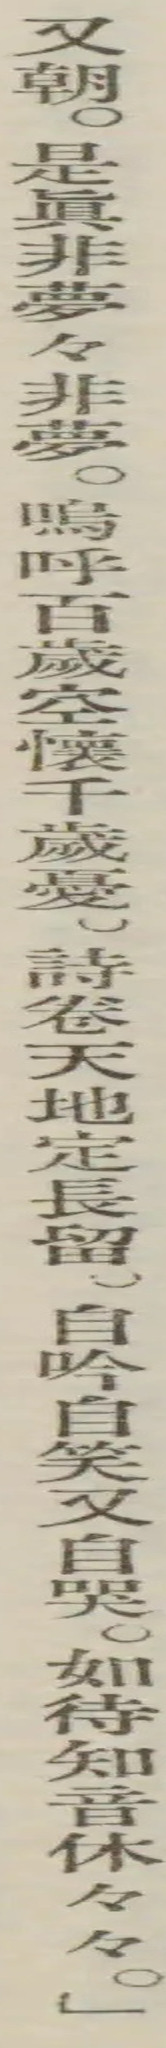又朝。是真被夢々非夢。鳴呼百歳空懐千歳憂。詩巻天地定長留。自吟自笑又自哭。如待知音休々々。」
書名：小野湖山翁小伝
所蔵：国立国会図書館 National Diet Library, JAPAN
